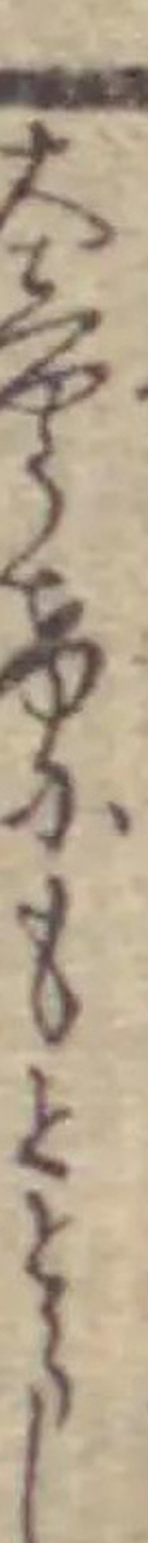大しやうけふもととうし
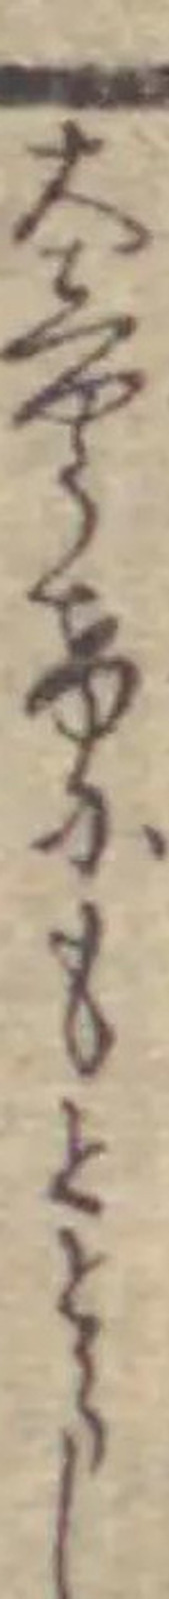大しやうけふもととうし
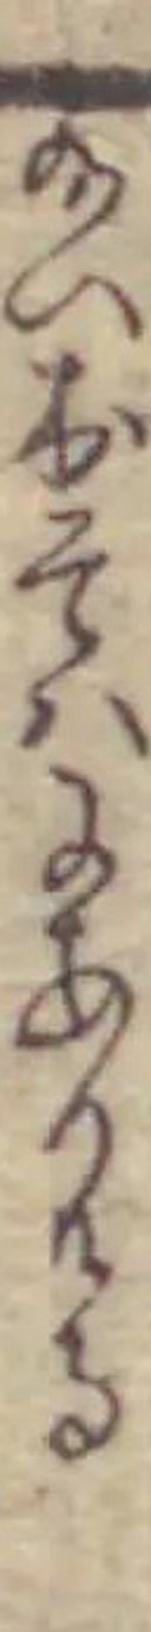給いおそはにありける
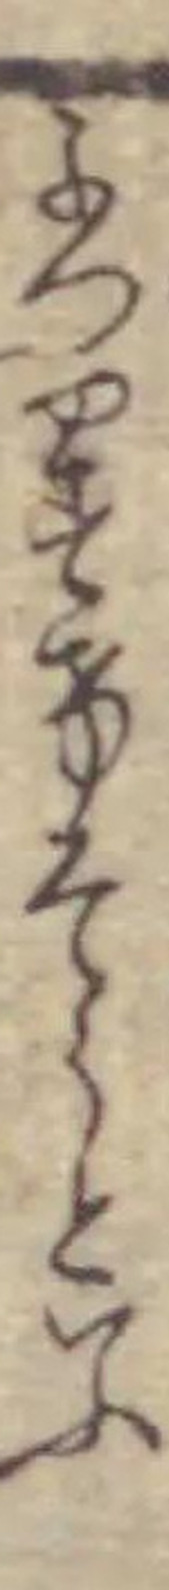よつやすけそうといふ
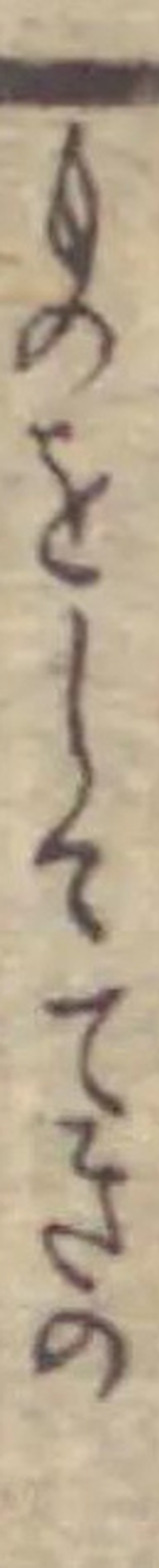ものをしててきの
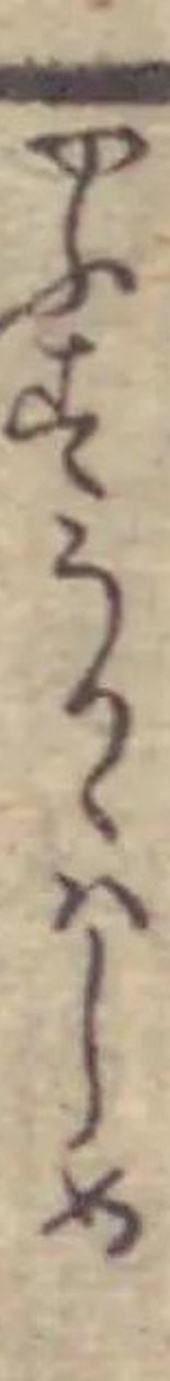やふすうかゝはしめ
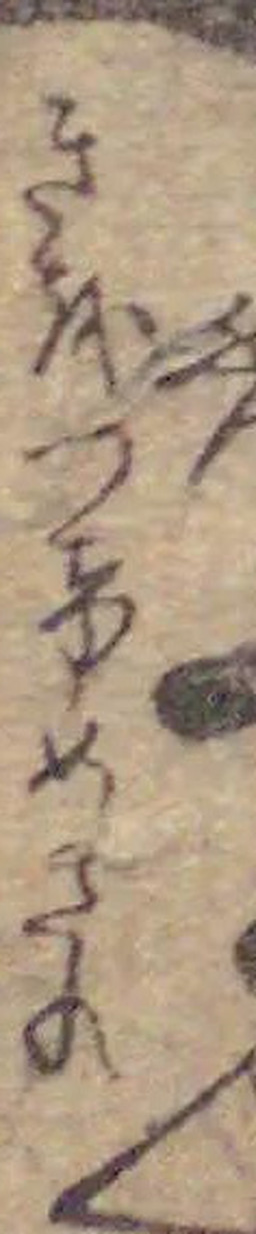きをつけめされ

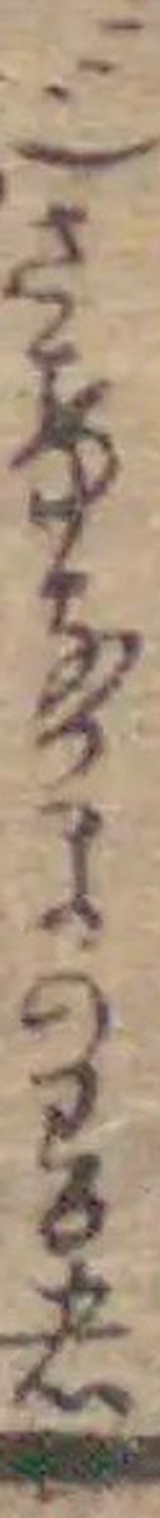さけなかまのわる者
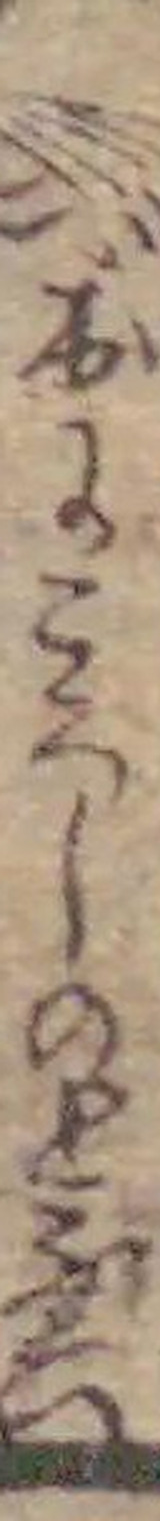おにころしのとふ六
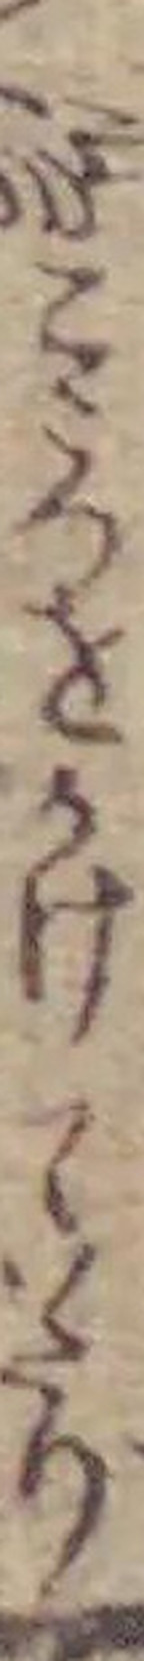こゝろをかけていたり
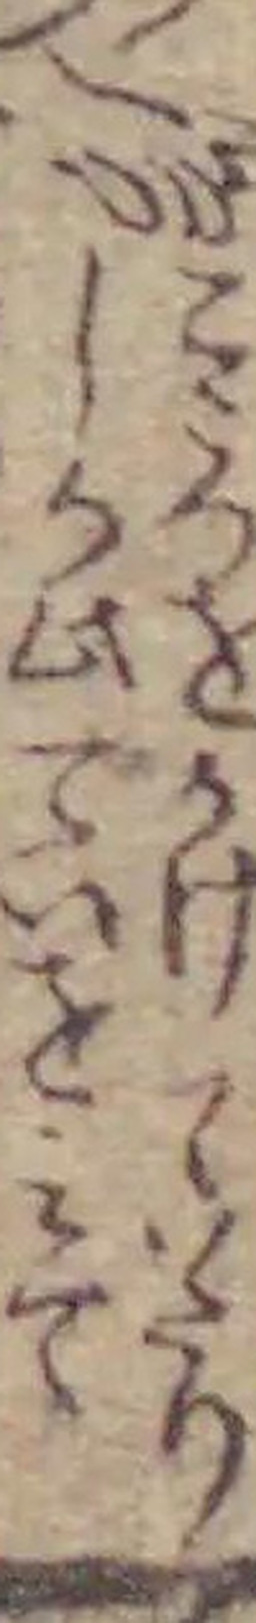しか此ていをみて
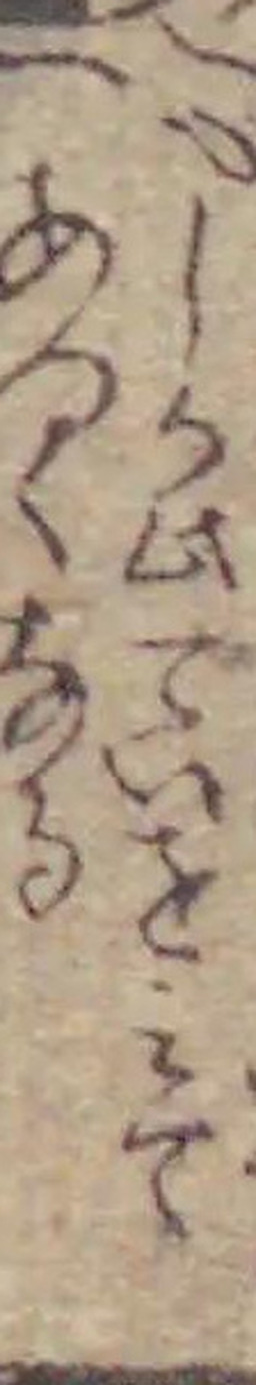あつくなる
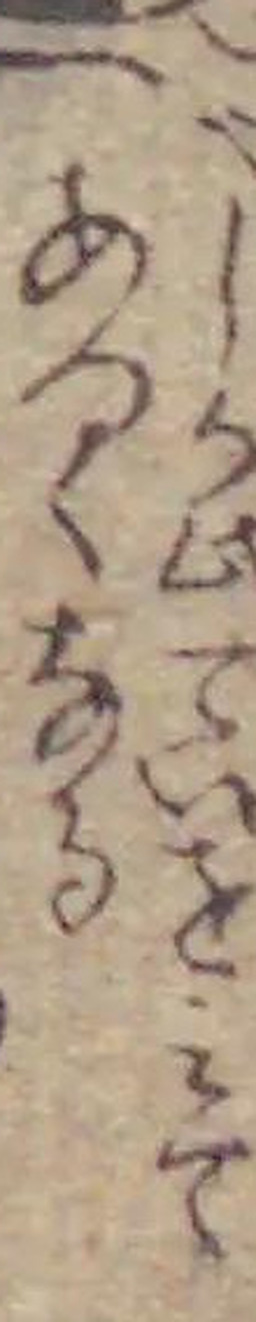あつくなる
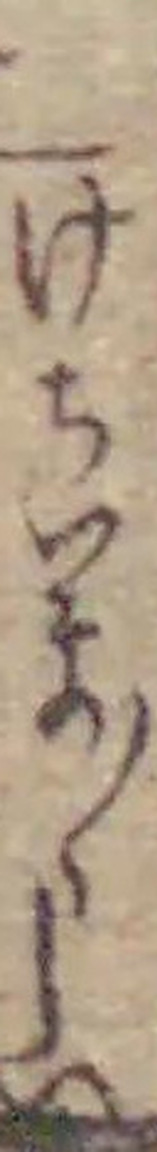けちいま〳〵しい
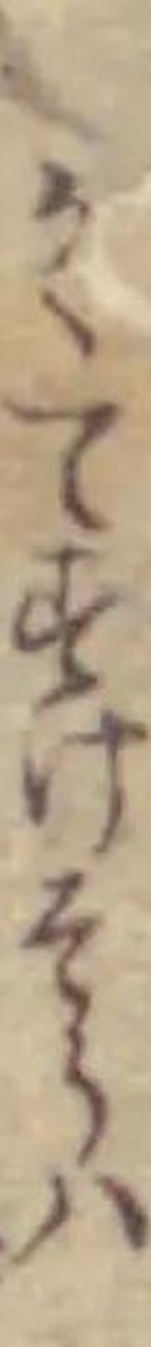かくてすけそうは
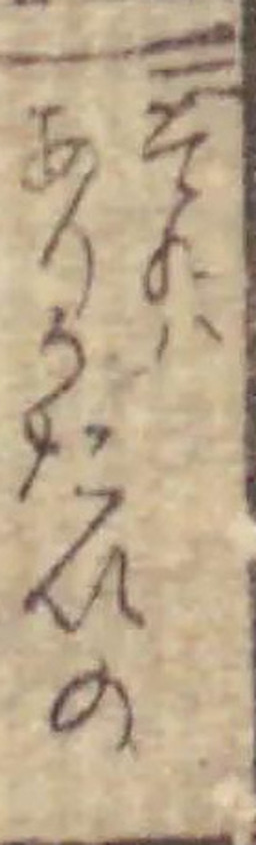ありかたいの
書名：餅酒腹中能同志 2巻
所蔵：国立国会図書館 National Diet Library, JAPAN
